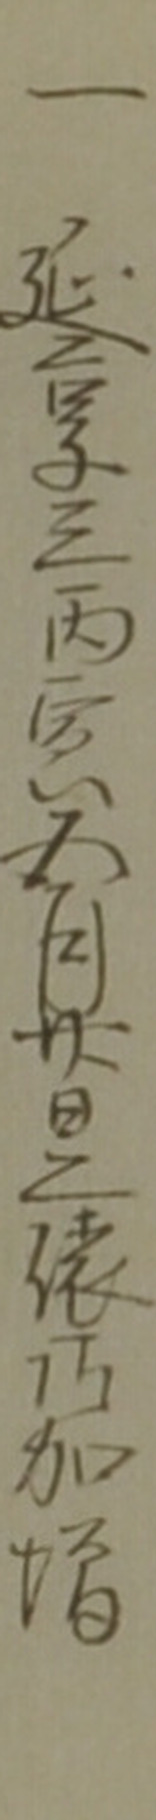一延慶三丙寅五月廿日二俵御加増
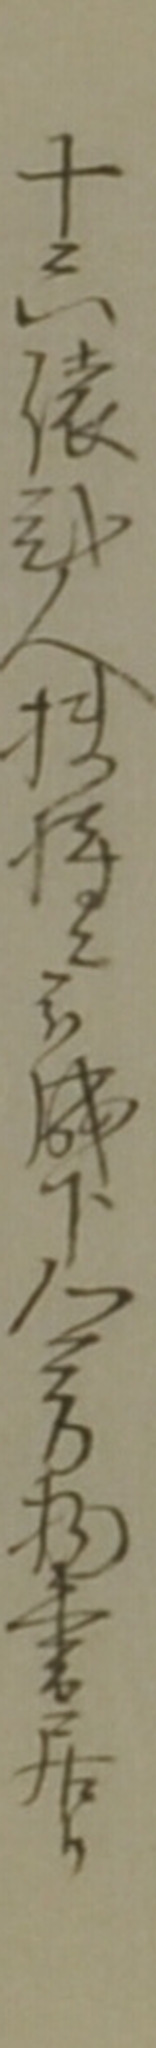十六俵弐人扶持ニ被成下郷方物書居り
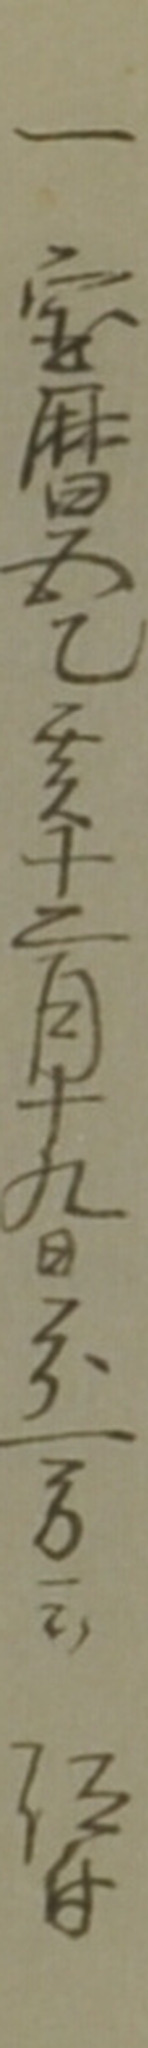一宝暦五乙亥十二月十九日分一方被仰付
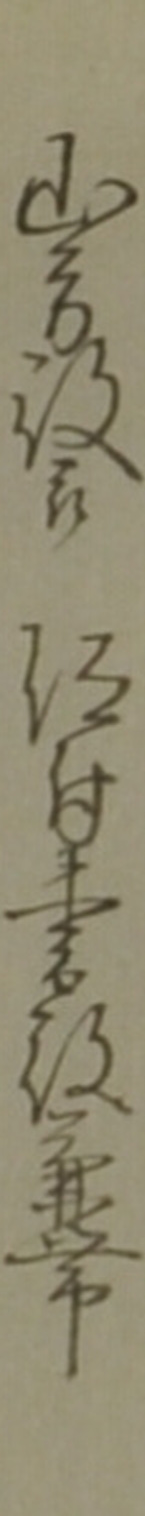山方役被仰付書役兼帯
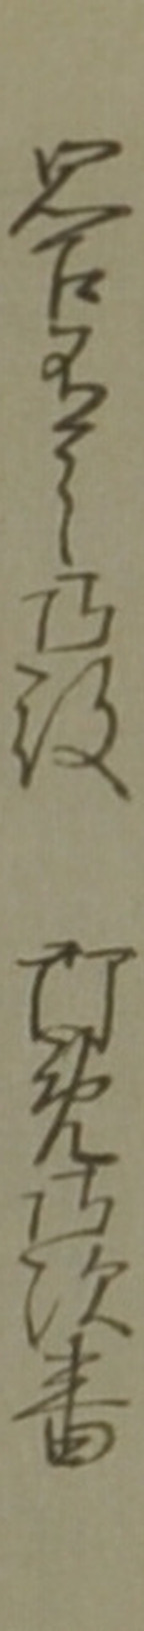思召有之御役御免御次番
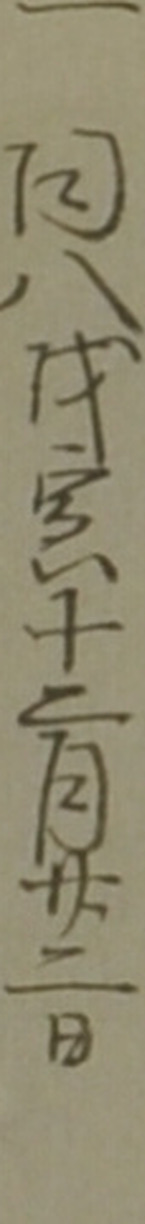一同八戌寅十二月廿二日
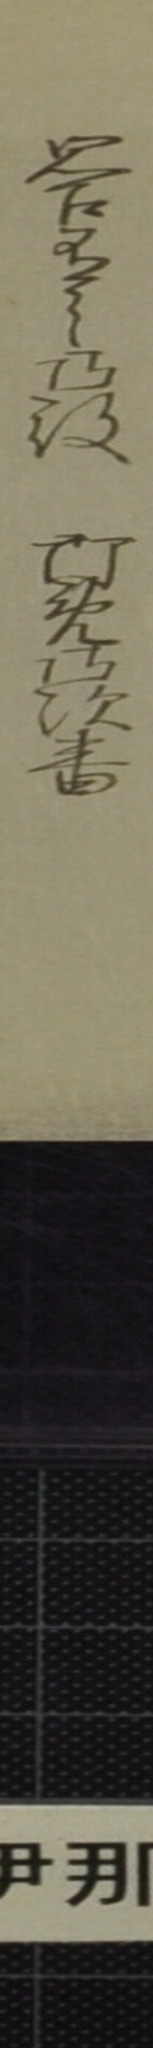思召有之御役御免御次番
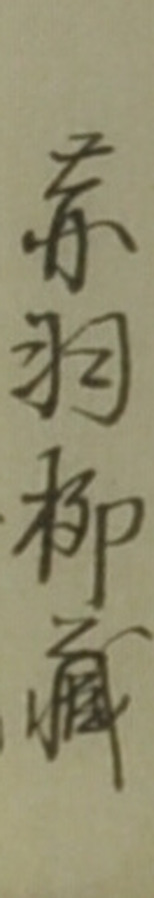赤羽柳蔵

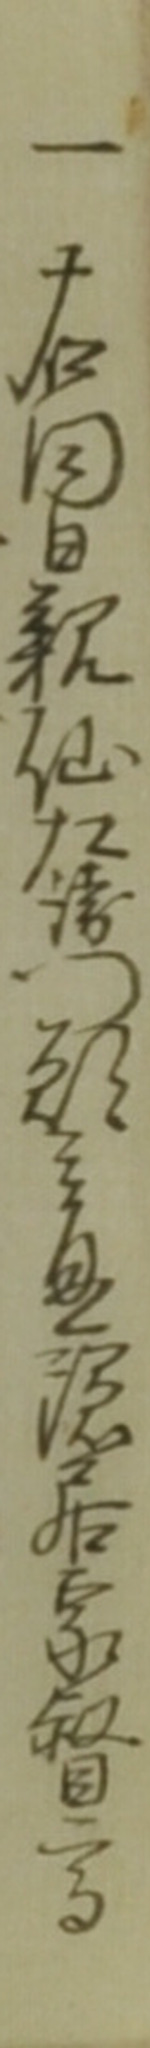一右同日親仙左衛門願之通隠居家督高
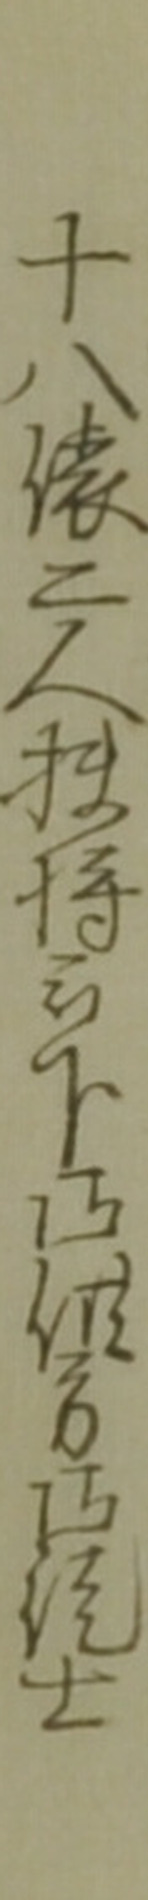十八俵二人扶持被下御供方御徒士
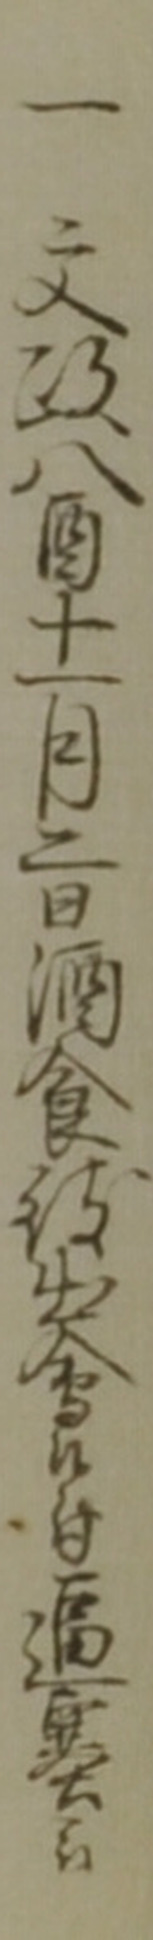一文政八酉十一月二日酒食致出会ニ付逼塞被
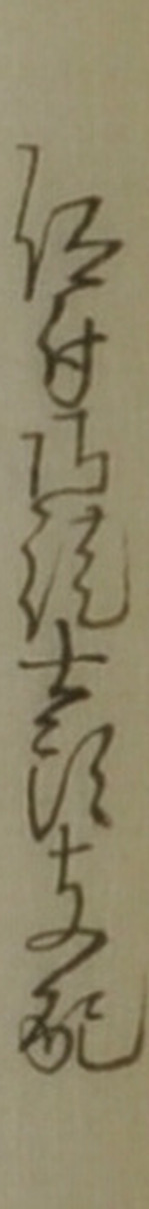仰付御徒士頭支配
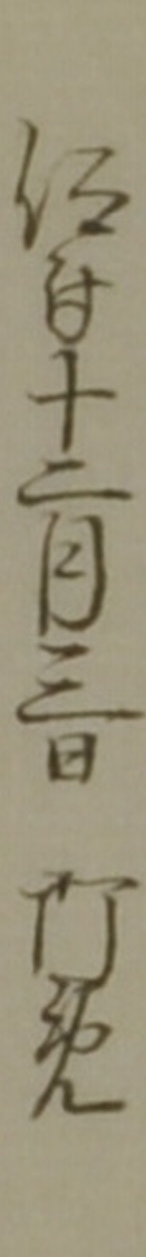仰付十二月三日御免
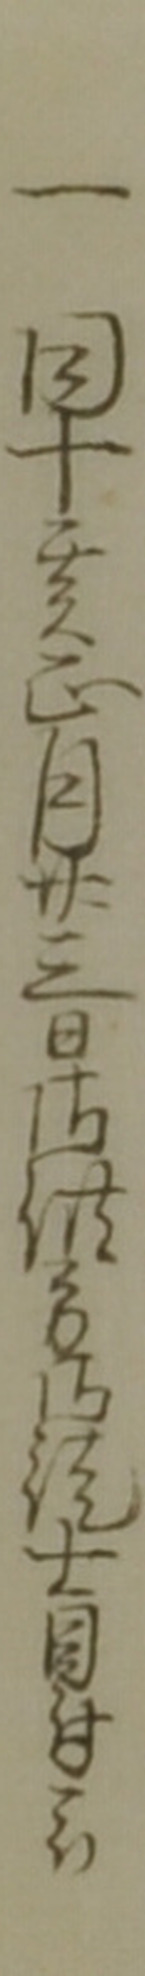一同十亥正月廿三日御供方御徒士目付被
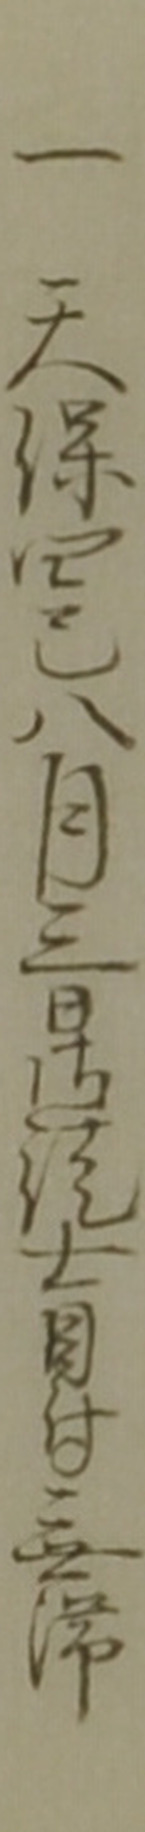一天保四巳八月三日御徒士目付無滞
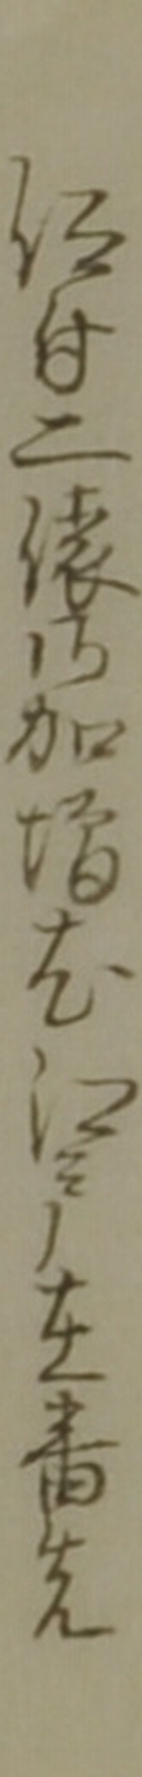仰付二俵御加増老江戸在番先
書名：無足諸士勤仕録（五）
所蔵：伊那市立高遠町図書館・合同会社AMANE
